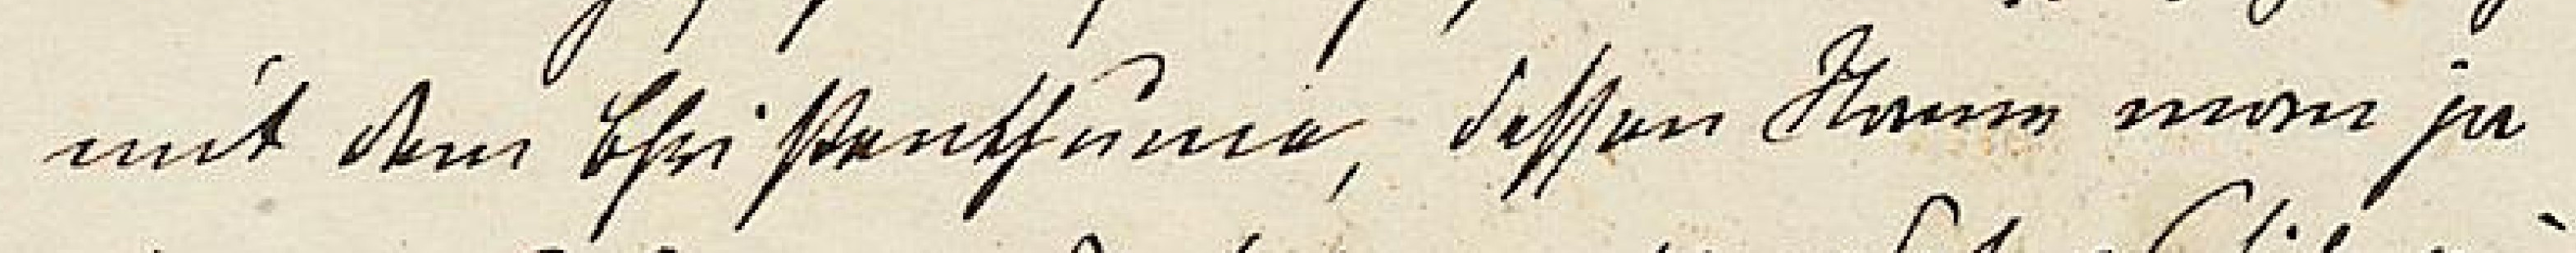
mit dem Christentume, dessen Nanme man ja
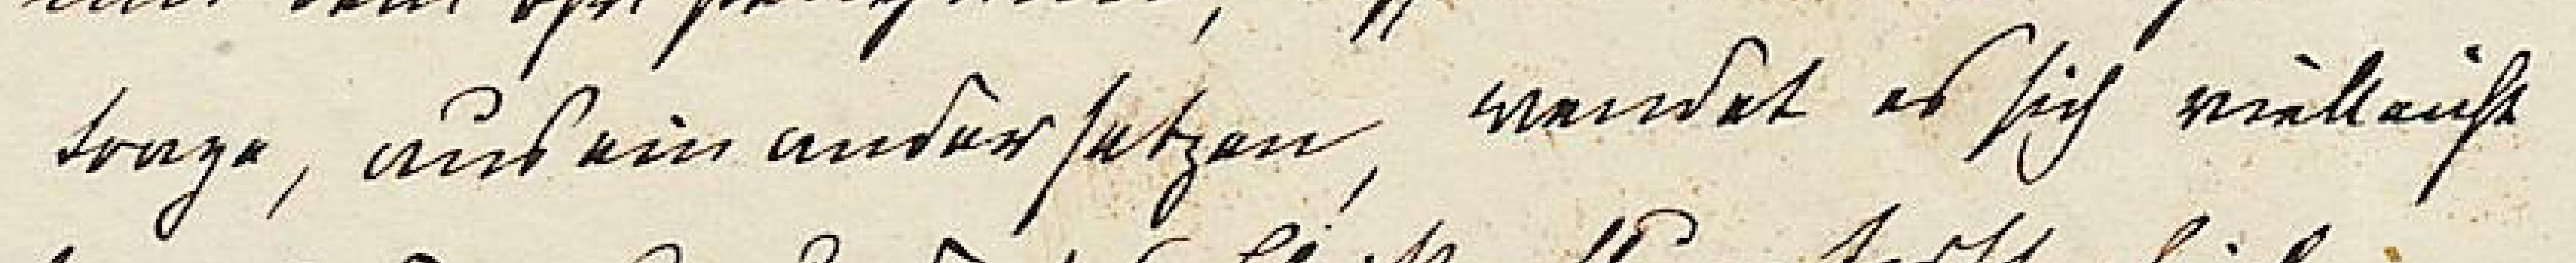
trage, auseinandersetzen, wendet es sich vielleicht
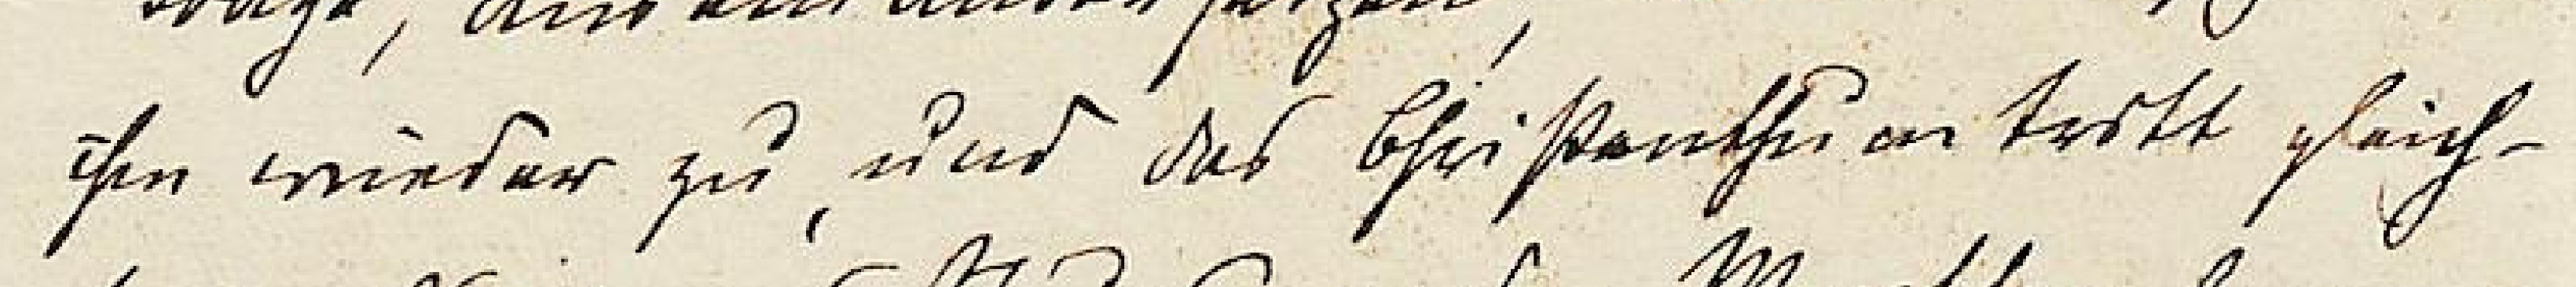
ihm wieder zu und das Christenthum tritt gleich¬
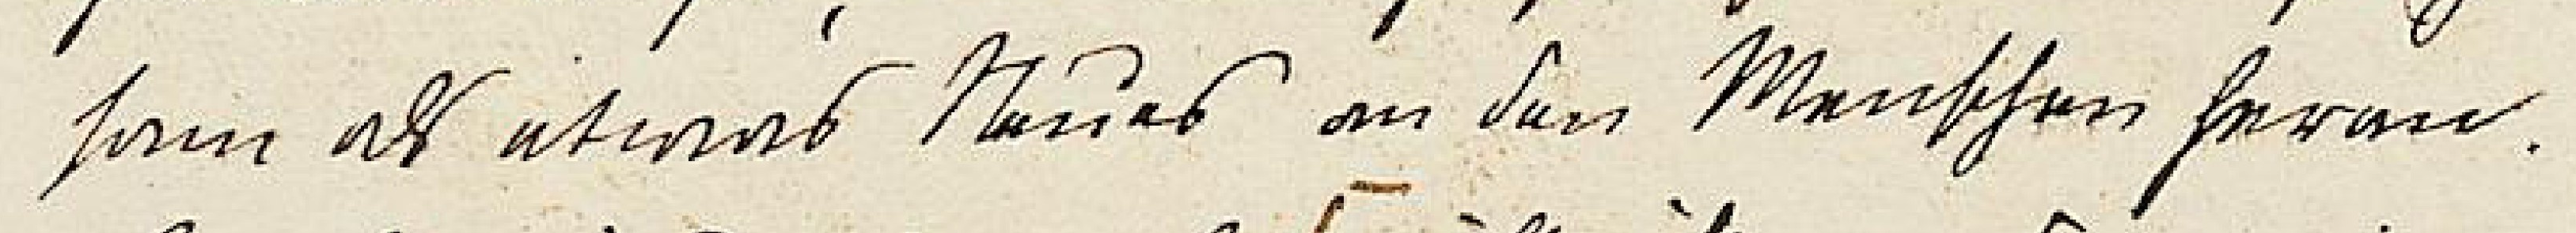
sam als etwas Neues an den Menschen heran.
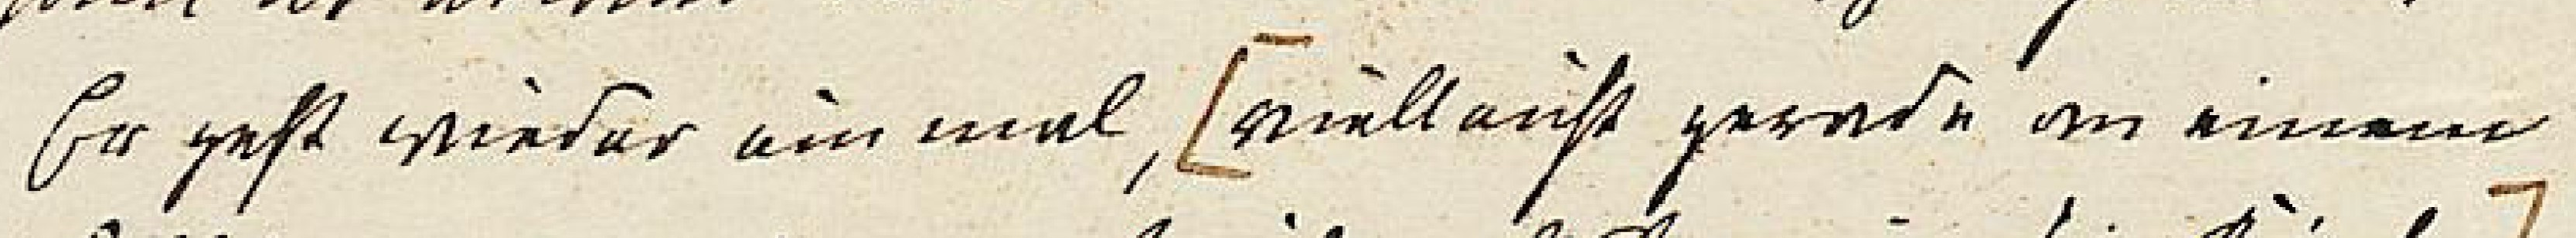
Er geht wieder einmal [vielleicht gerade an einem
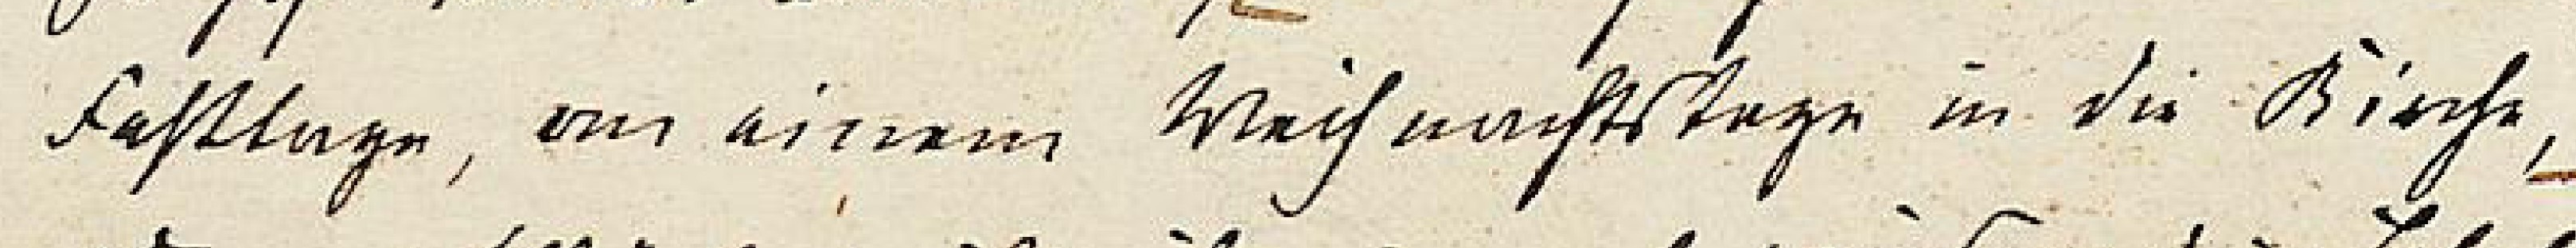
Festtage, an einem Weichnachtstage in die Kirche,
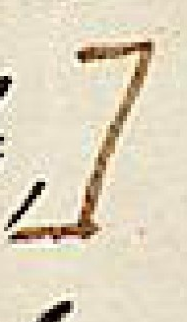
]
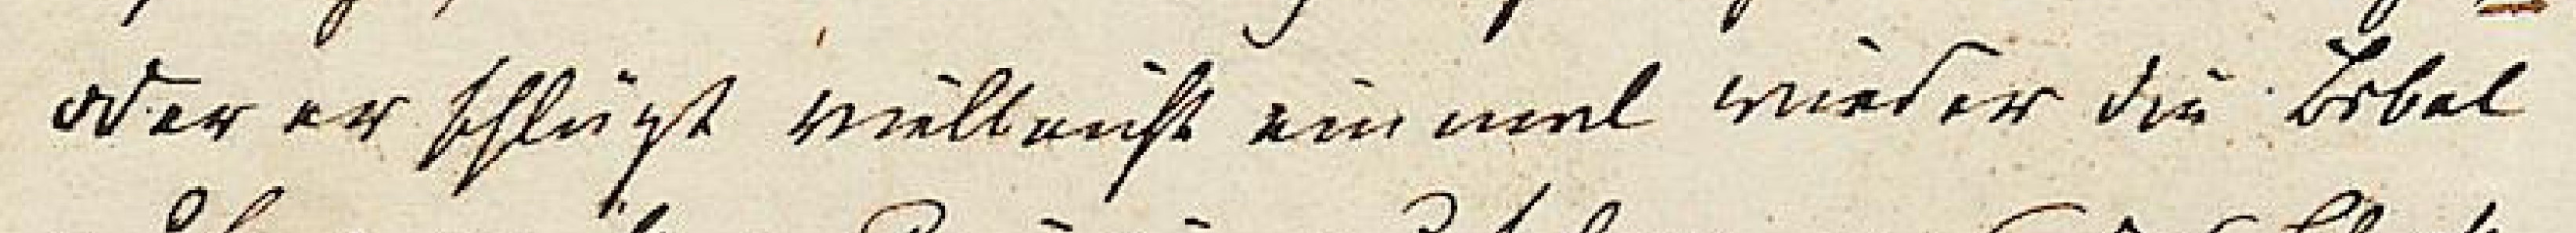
oder er schlägt vielleicht einmal wieder die Bibel
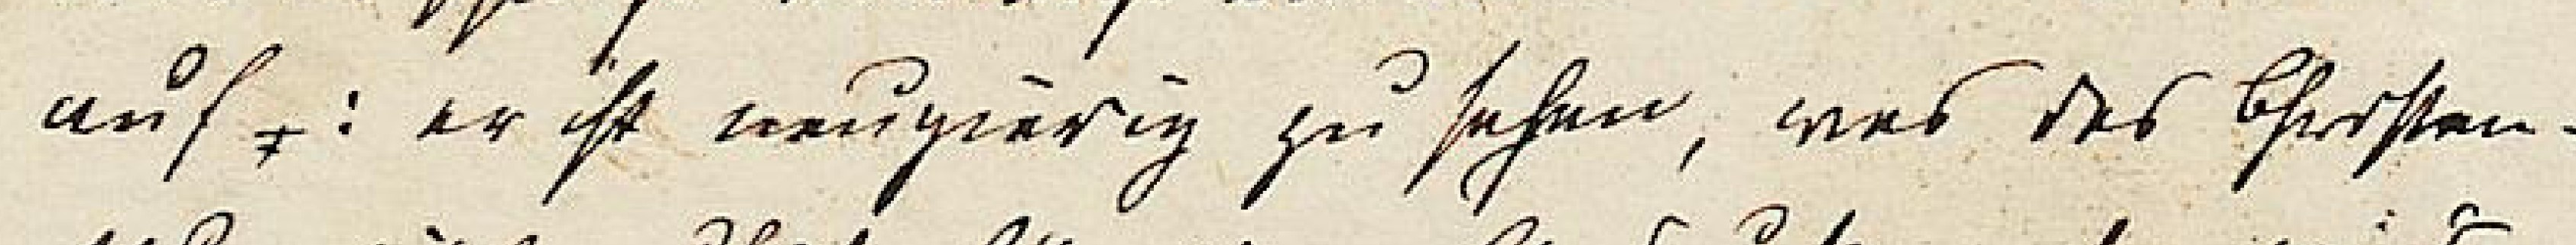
auf,: er ist neugierig zu sehen, wes das Christen¬
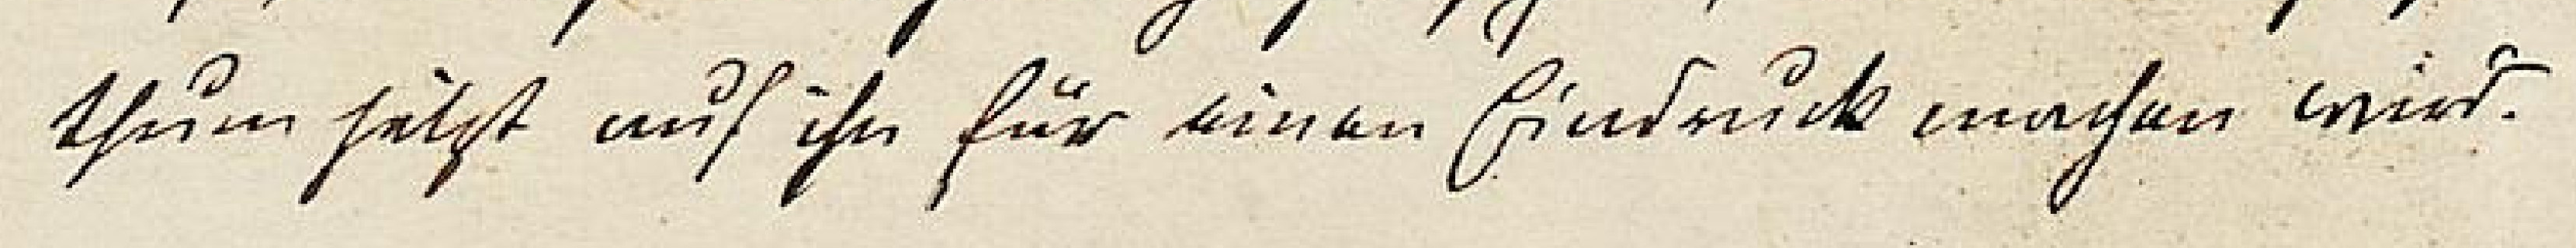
thum jetzt auf ihn für einen Eindruck machen wird.
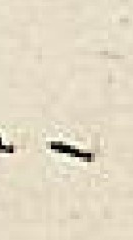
-
